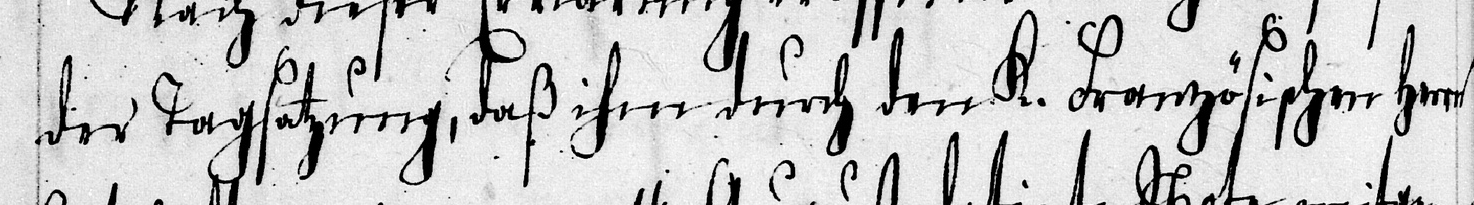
der Tagsatzung, daß ihm durch den K. Französischen He¬
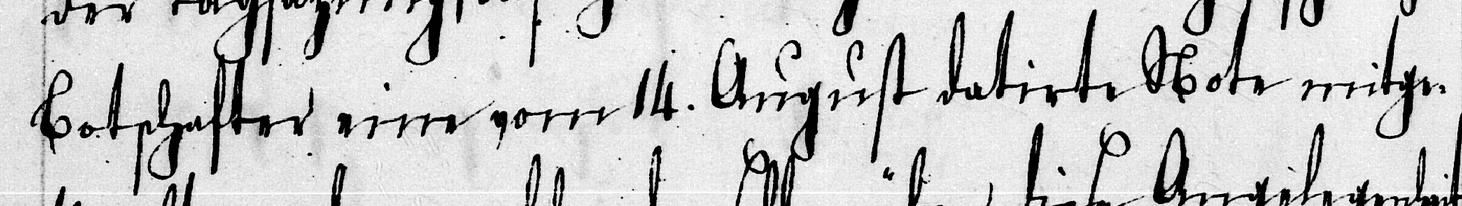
Botschafter eine vom 14. August datirte Note mitge¬
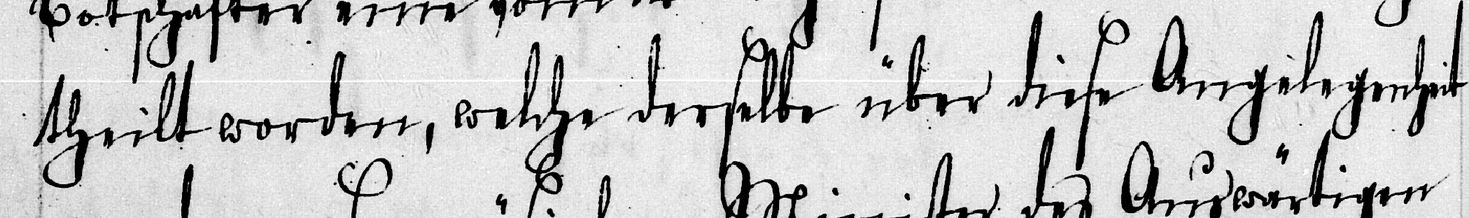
theilt worden, welche derselbe über diese Angelegenh¬
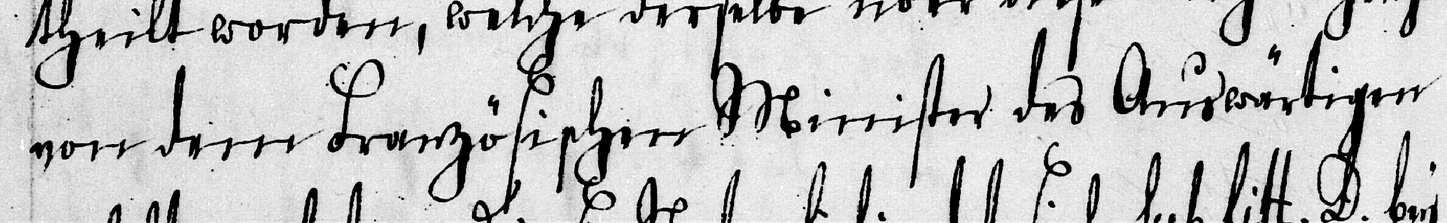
von dem Französischen Minister des Auswärtigen
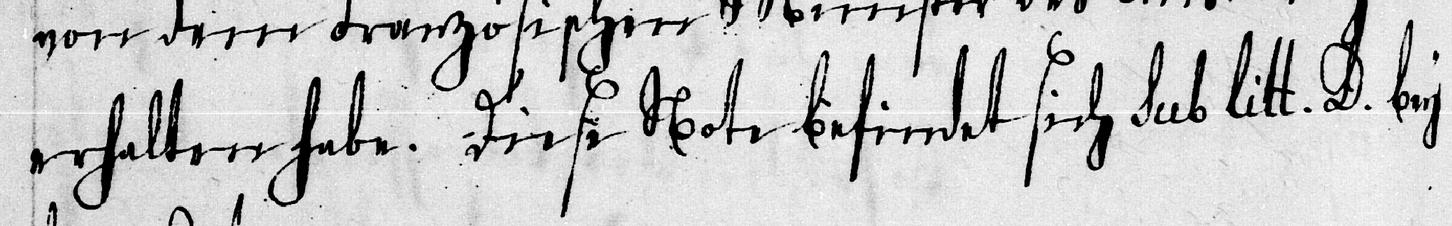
erhalten habe. Diese Note befindet sich Sub litt. D.
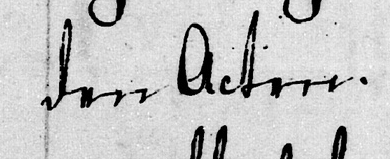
den Acten.
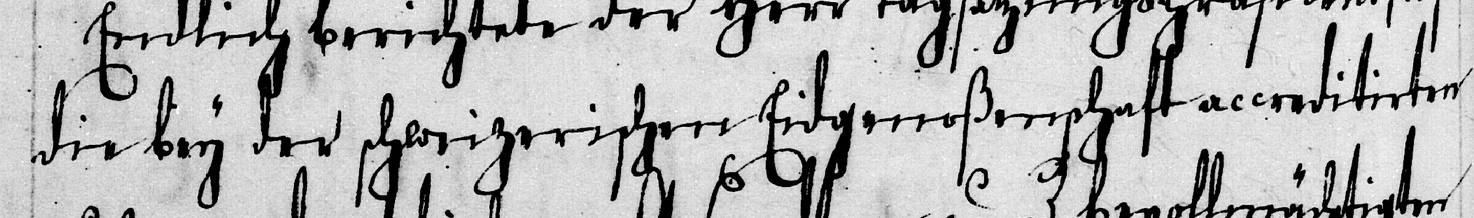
die bey der schweizerischen Eidgenoßenschaft accreditirten
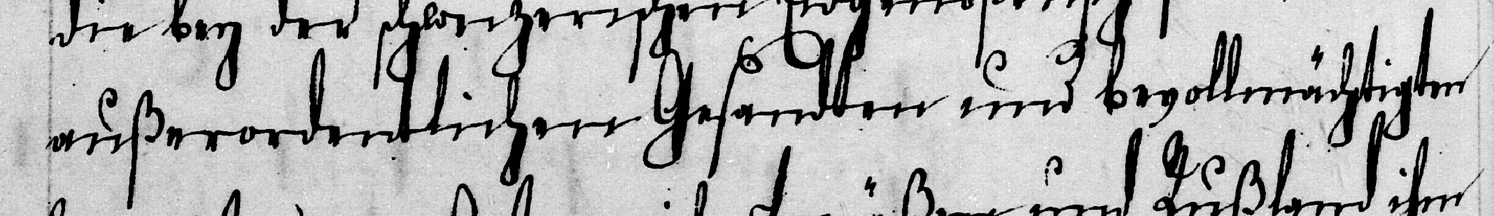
außerordentlichen Gesandten und bevollmächtigten
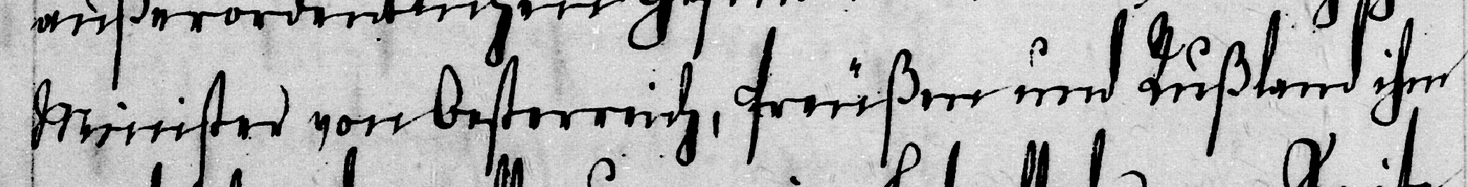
Minister von Oesterreich, Preußen und Rußland ihm
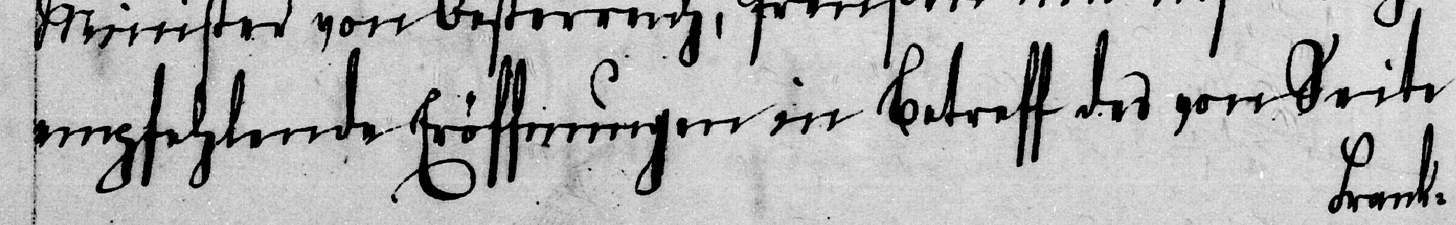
empfehlende Eröffnungen in Betreff des von Seite
